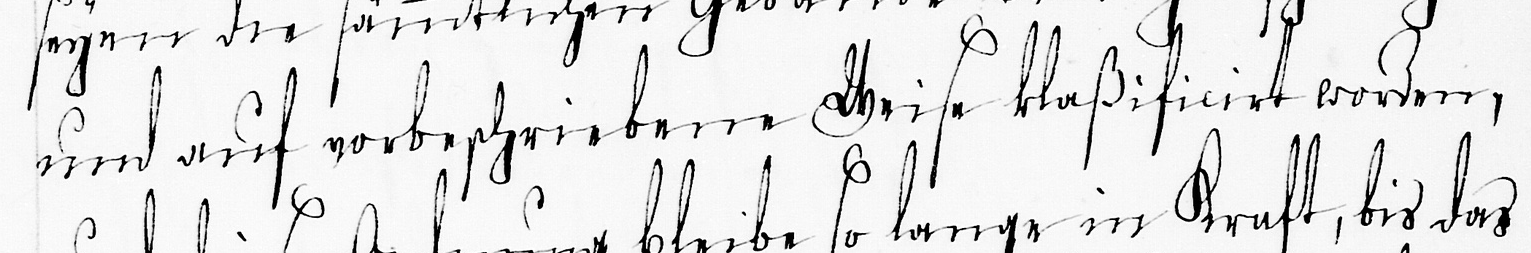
und auf vorbeschriebene Weise klaßificirt worden,
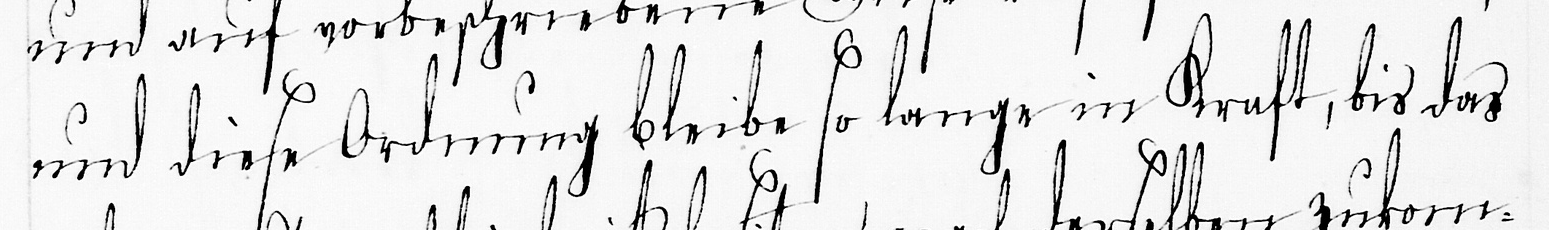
und diese Ordnung bleibe so lange in Kraft, bis das
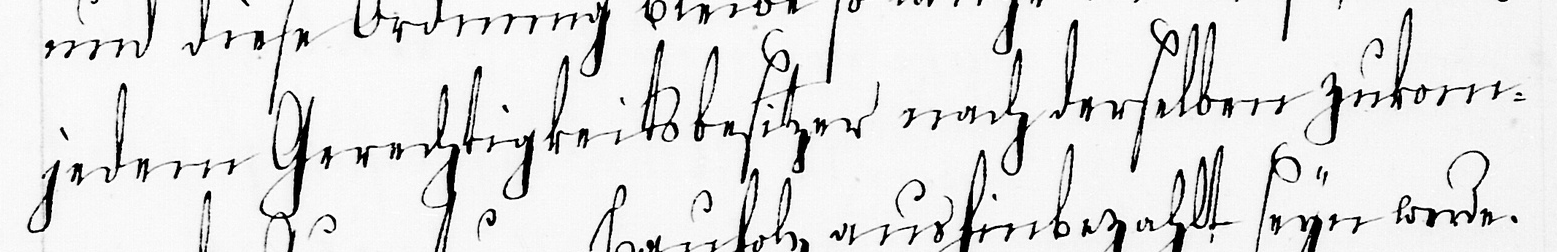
jedem Gerechtigkeitsbesitzer nach derselben zukom¬
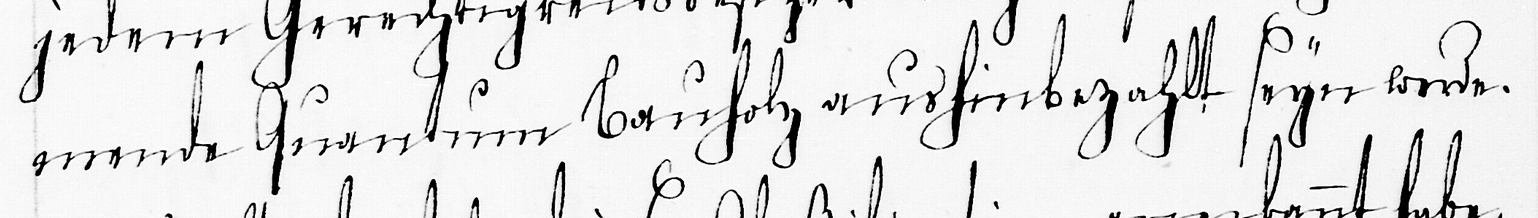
mende Quantum Bauholz aushinbezahlt seyn werde.
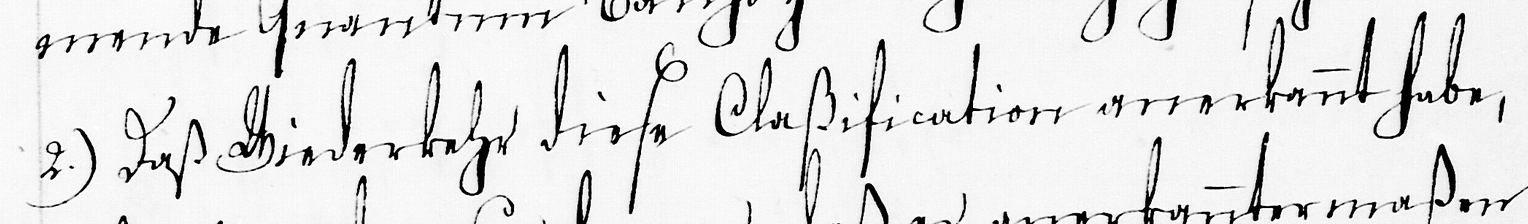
2.) Daß Wiederkehr diese Claßifikation anerkannt habe,
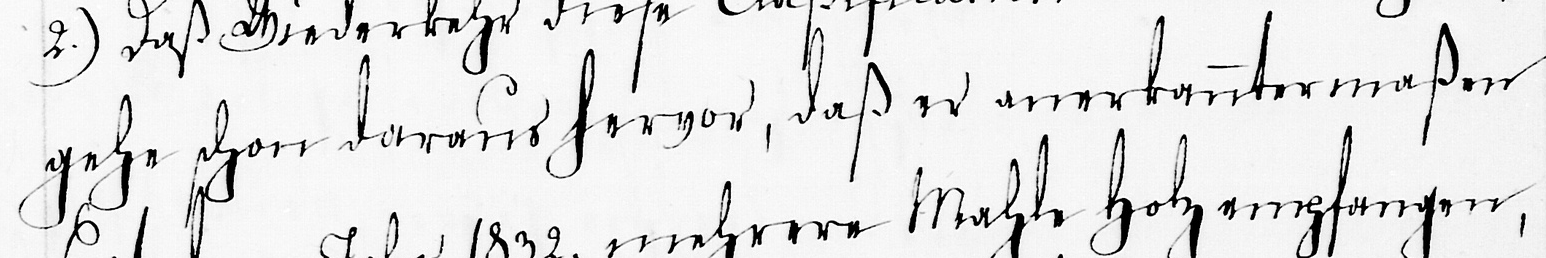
gehe schon daraus hervor, daß er anerkanntermaßen
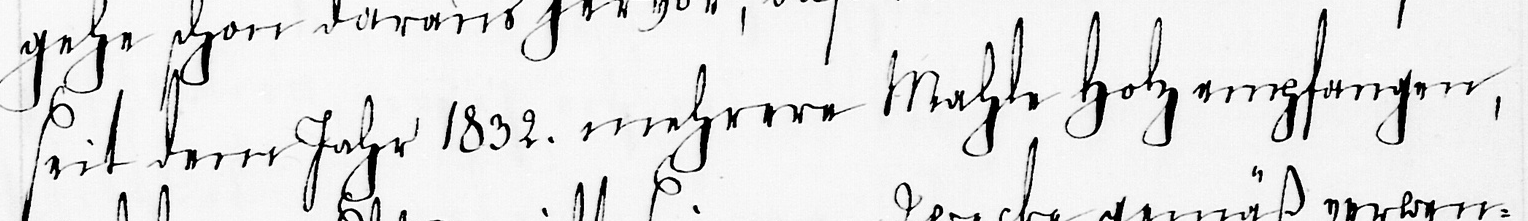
seit dem Jahr 1832. mehrere Mahle Holz empfangen,
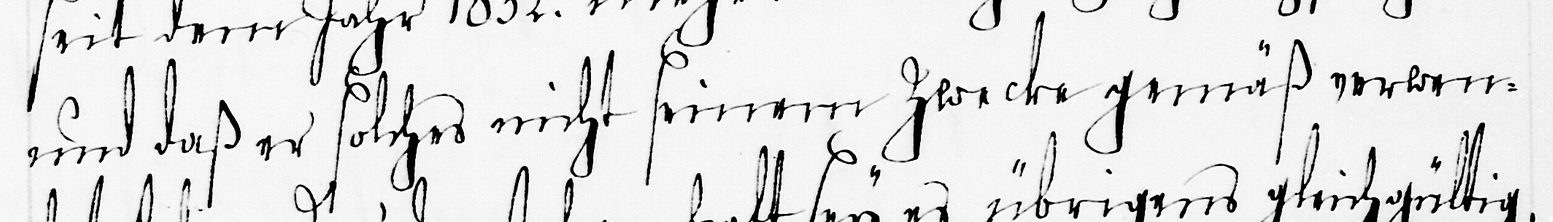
und daß er solches nicht seinem Zwecke gemäß verwen¬
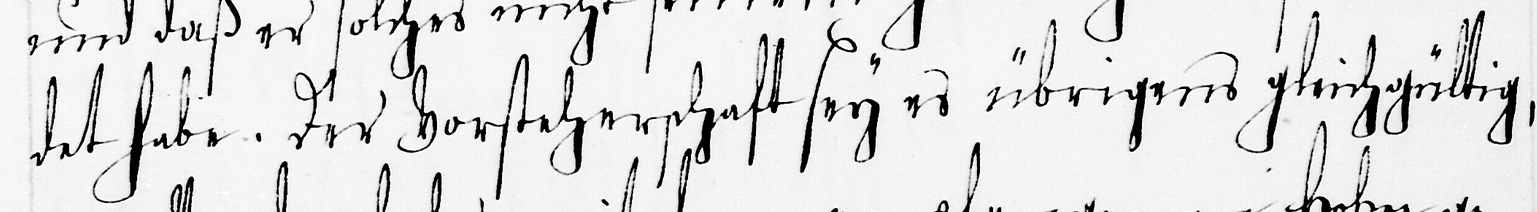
det habe. Der Vorsteherschaft sey es übrigens gleichgültig,
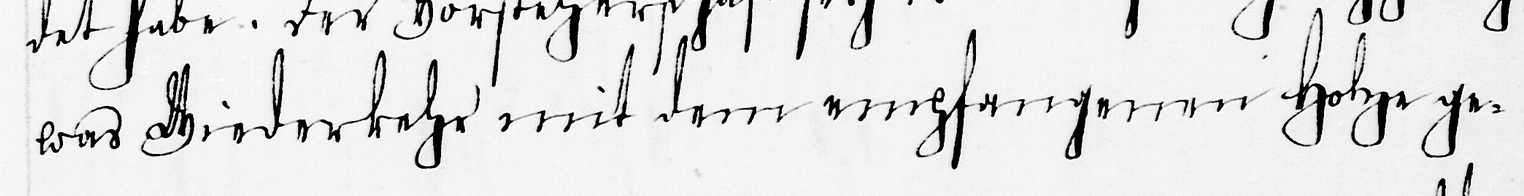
was Wiederkehr mit dem empfangenen Holze ge-
